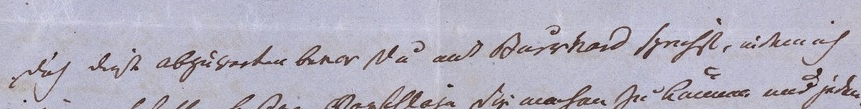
Dich diese abzuwarten bevor Du mit Burkard sprichst, indem ich
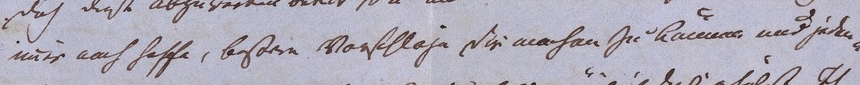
immer noch hoffe, beßere Vorschläge Dir machen zu können und jeden-
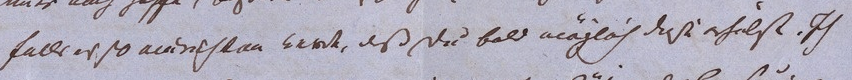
falls es so einrichten werde, daß Du bald möglich diese erhälst. Ich
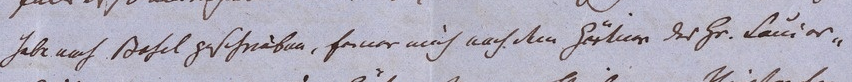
habe nach Basel geschrieben, ferner mich nach dem Gärtner des Hr. Laui er-
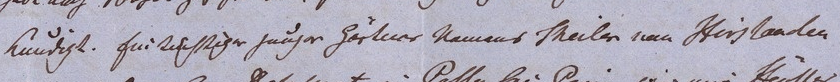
kundigt. Ein tüchtiger junger Gärtner Namens Theiler von Hirslanden
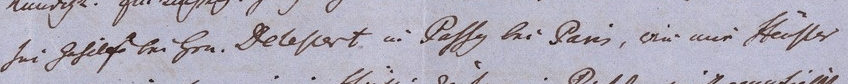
sei Gehilfe bei Hrn. Delessert in Passy bei Paris, wie mir Heusser
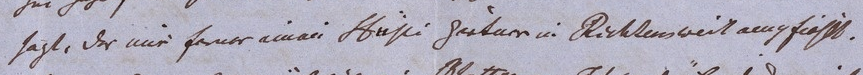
sagt, der mir ferner einen Hüssi Gärtner in Richtensweil empfiehlt.
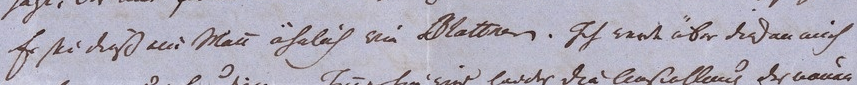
Es sei dieß ein Mann ähnlich wie Blattner. Ich werde über diesen mich
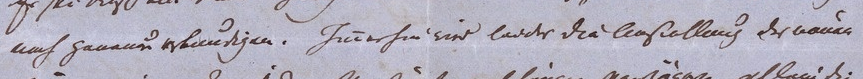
noch genauer erkundigen. Immerhin wird leider die Anstallung des neuen
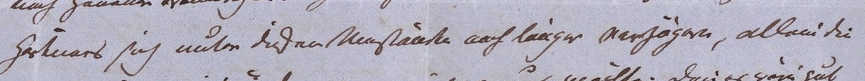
Gärtners sich unter diesen Umständen noch länger verzögern, allein die
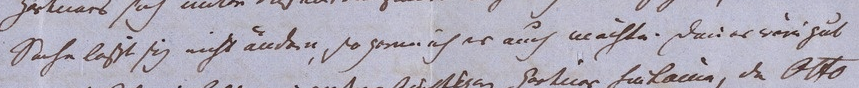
Sache läßt sich nicht ändern, so gerne ich es auch möchte. Denn es wäre gut
